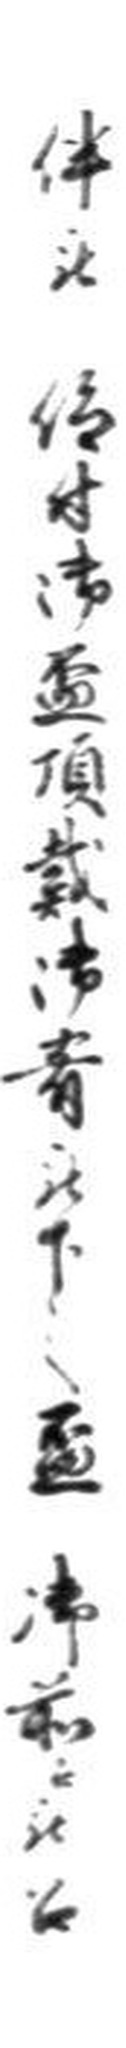伴被仰付御盃頂戴肴被下之盃御前江被召
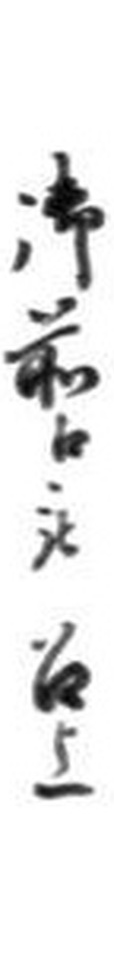御前江被召上
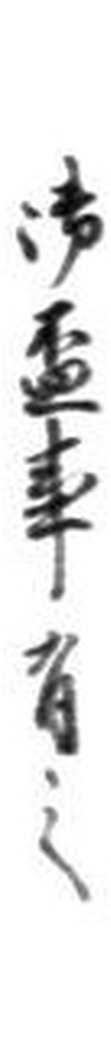御盃事有之
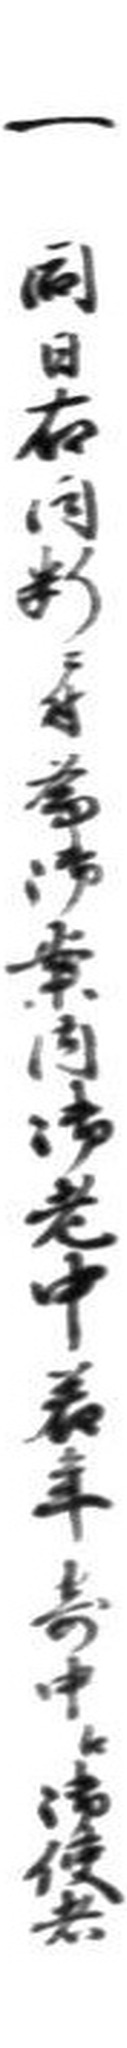一同日右同断ニ付為御案内御老中若年寄中江御使者
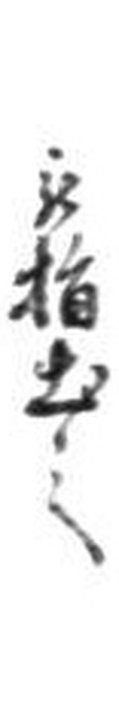被指出之
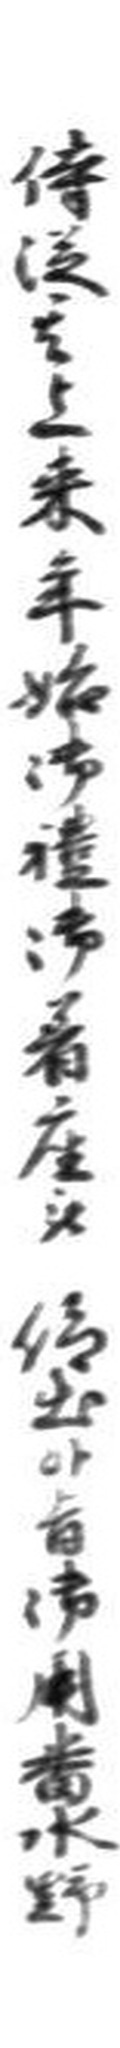侍従其上来年始御礼御着座被仰出候旨御用番水野

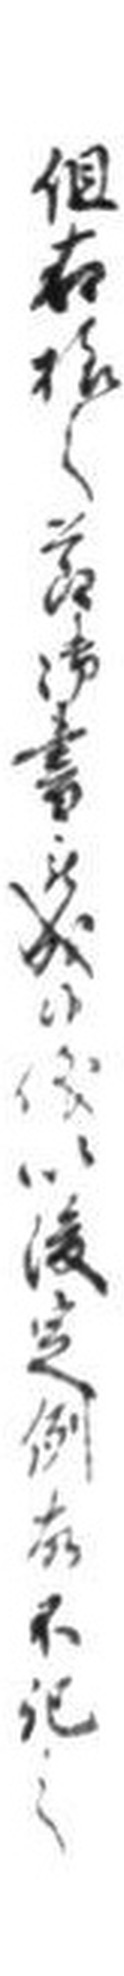但右様之節御書被成候儀以後定例故不記之
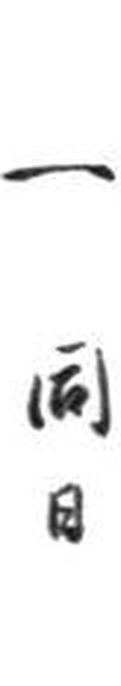一同日
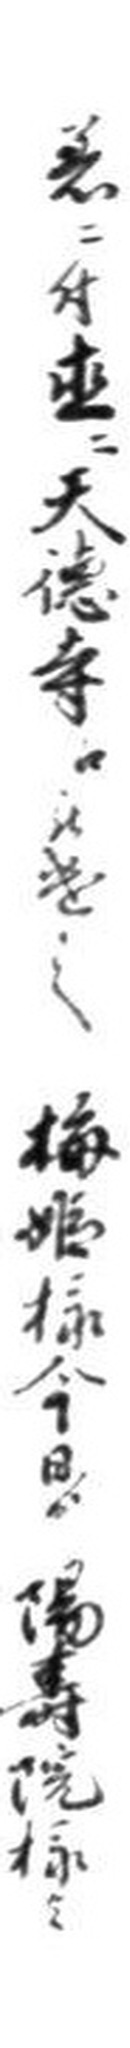着ニ付直ニ天徳寺江被遣之梅姫様今日ゟ陽寿院様与
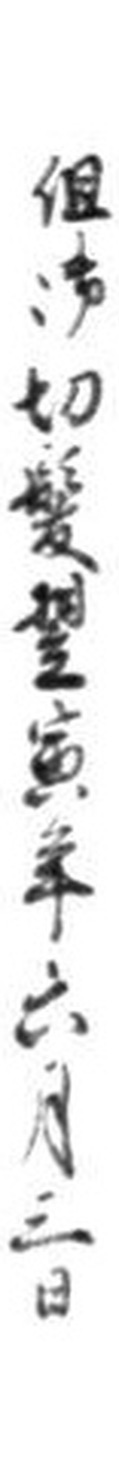但御切髪翌寅年六月三日
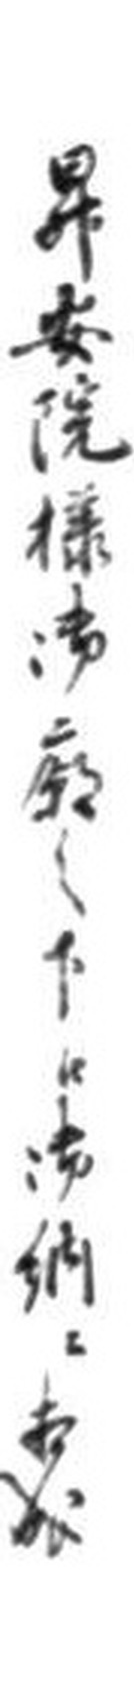昇安院様御廟之下江御納ニ相成
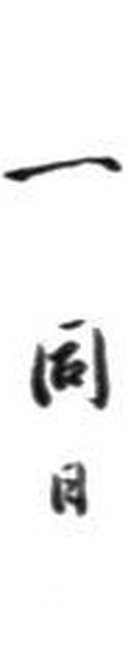一同日
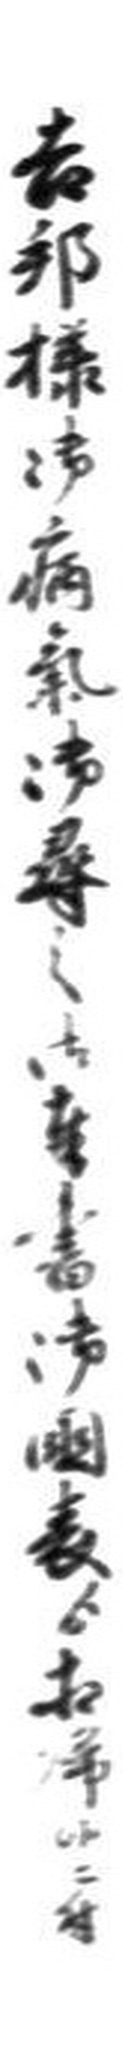吉邦様御病気御尋之御奉書御国表ゟ相帰候ニ付
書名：家譜 三十五 宗昌公 従享保六年到同七年
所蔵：福井県文書館 Fukui Prefectural Archives
